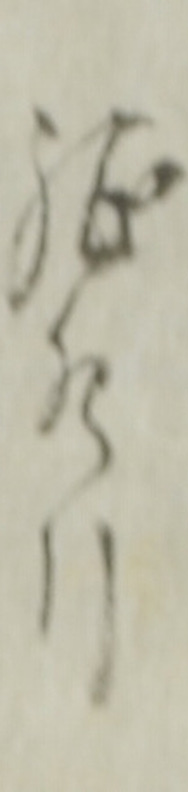紙水引
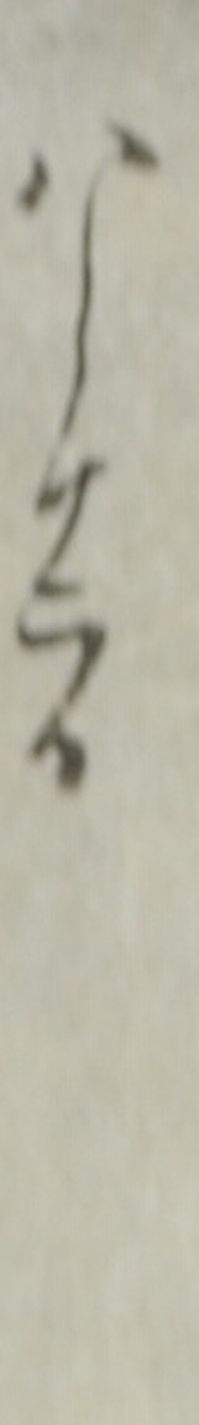八月十二日
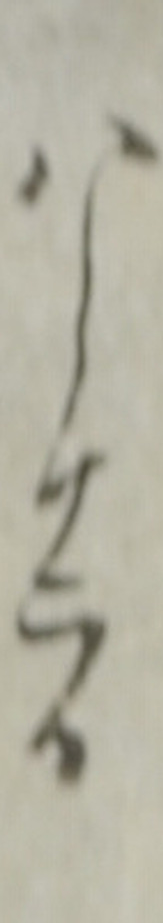八月十二日

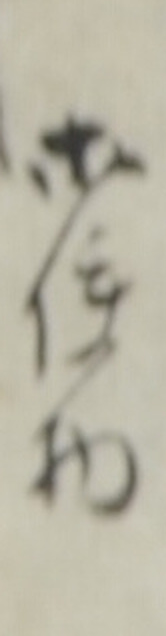御使物
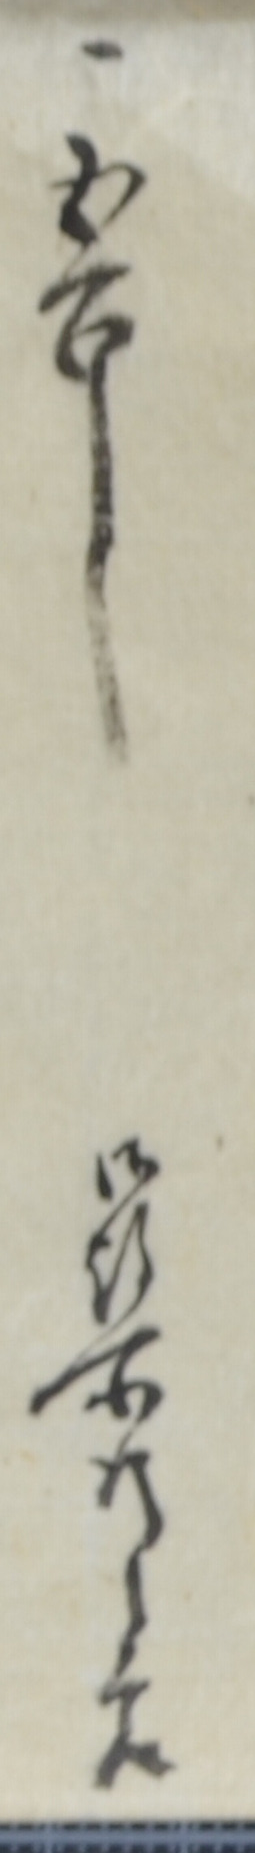一五百文御役所行之節
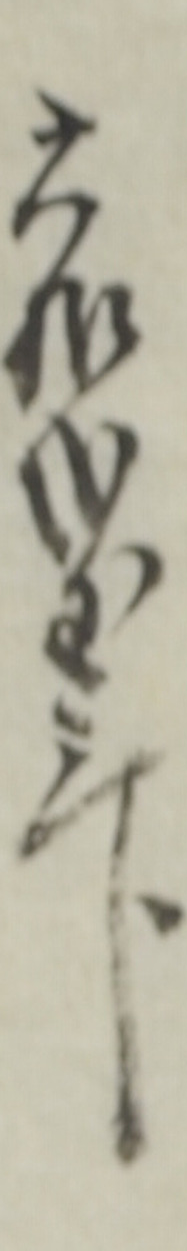〆六拾弐匁三分
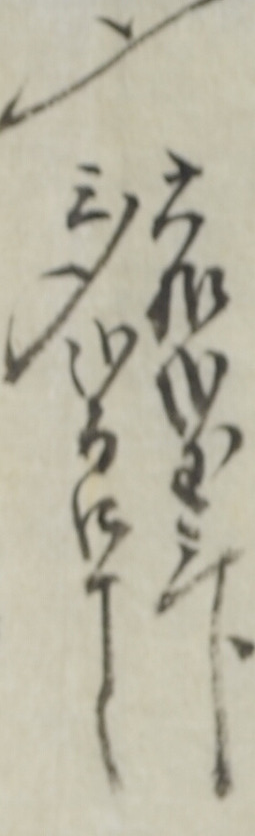三貫弐百四十文
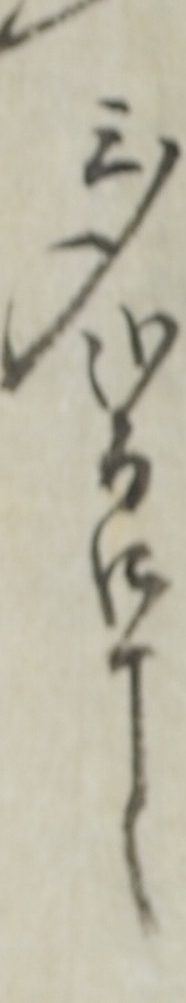三貫弐百四十文
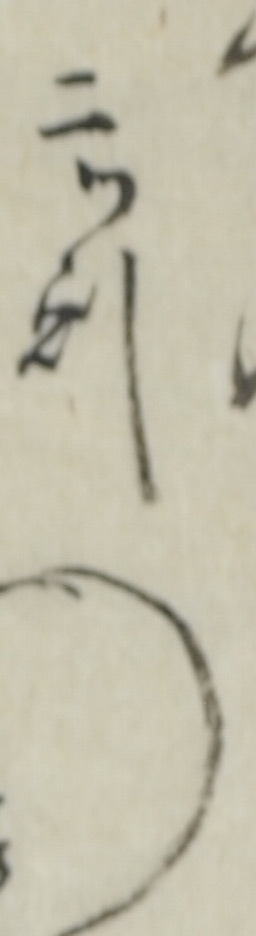二ツ割

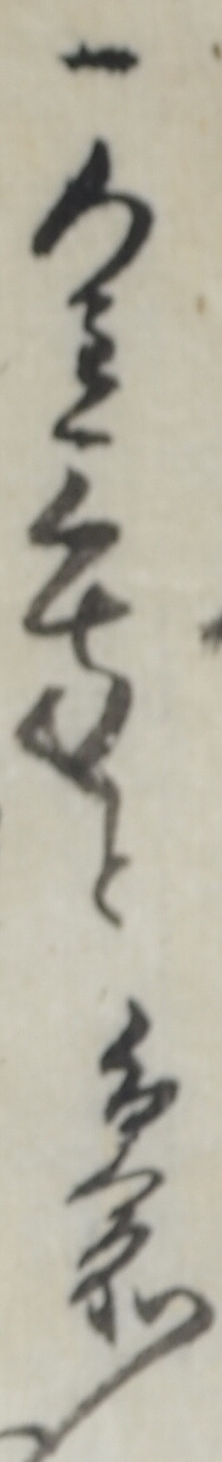一金三両と受取〆
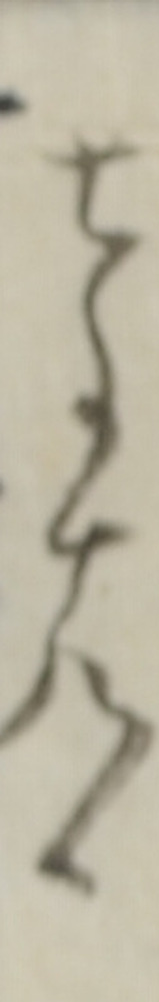七月十八日
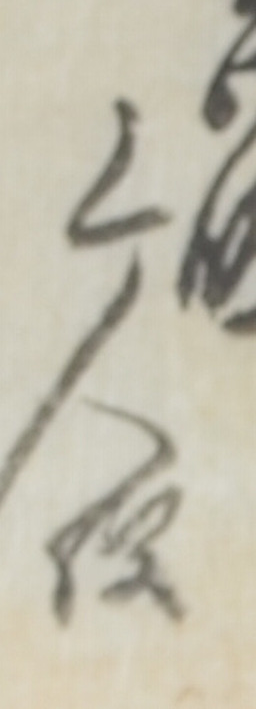三人様
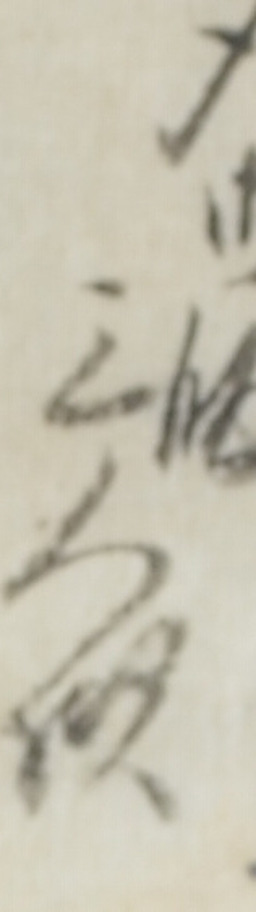三人様
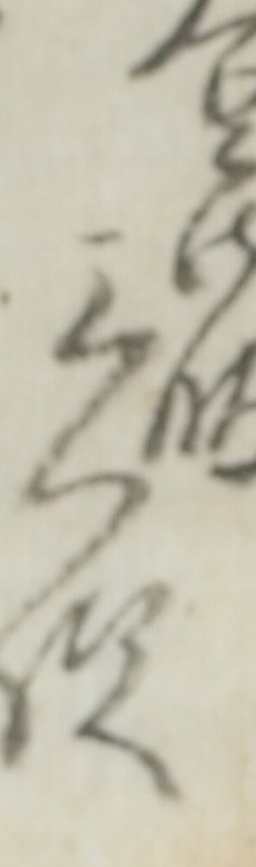三人様
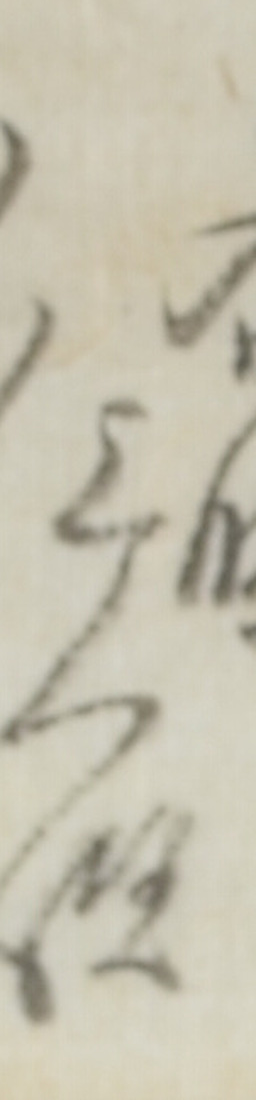三人様
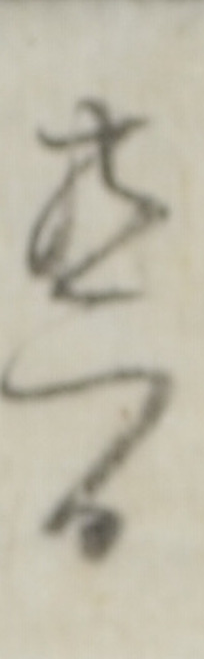廿二日
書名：（金銭書上控）
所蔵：伊那市立高遠町図書館・合同会社AMANE
